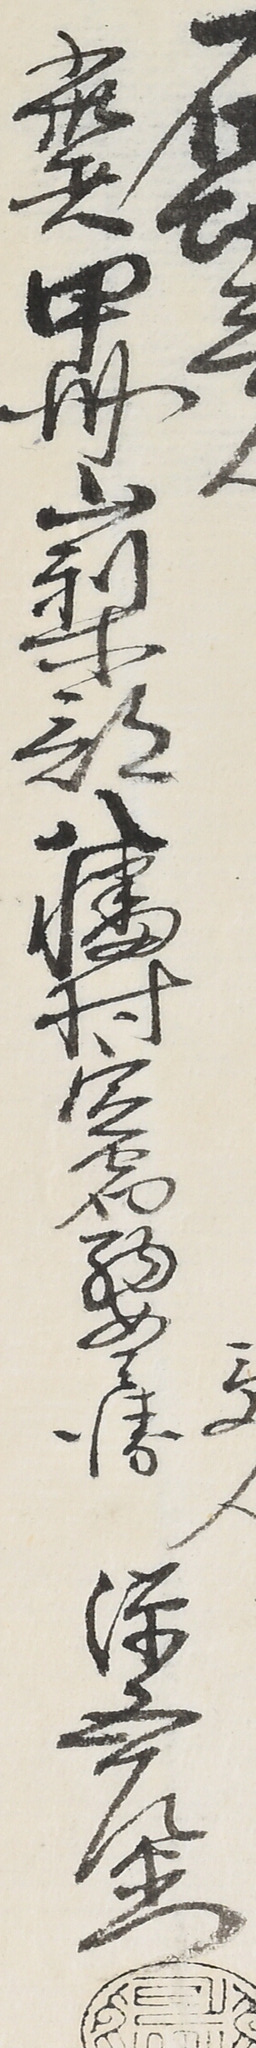此者甲州山梨郡八幡村定宿要兵衛受人源五左衛門

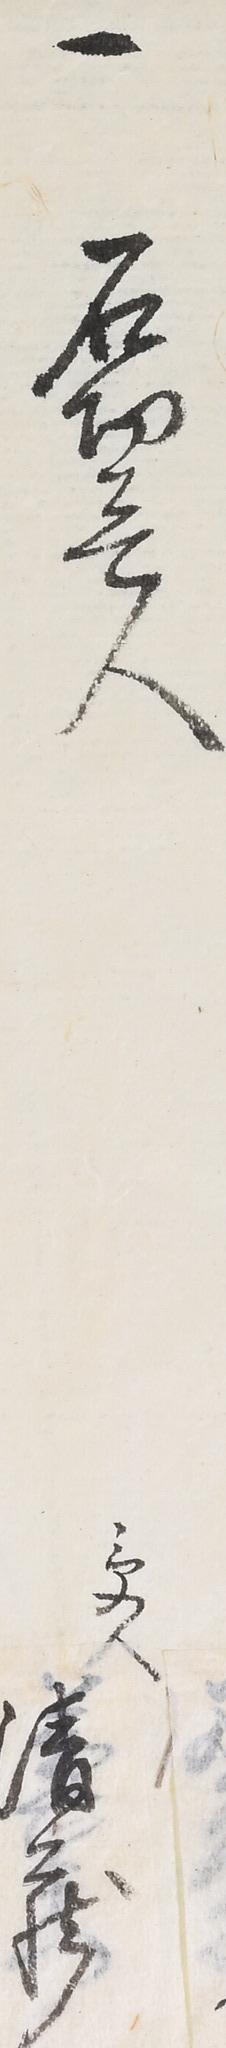一石切壱人芳蔵
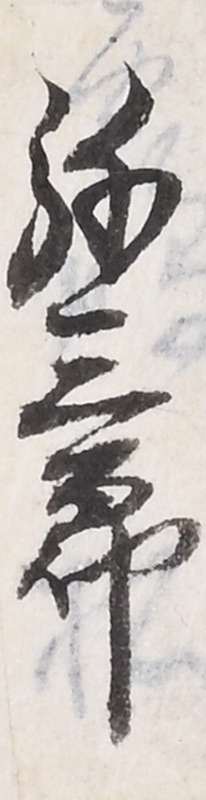弥三郎
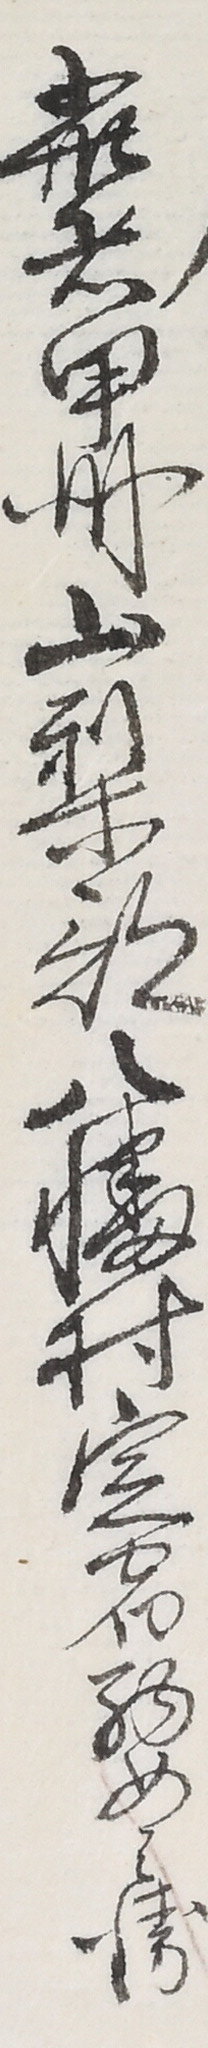此者甲州山梨郡八幡村定宿要兵衛
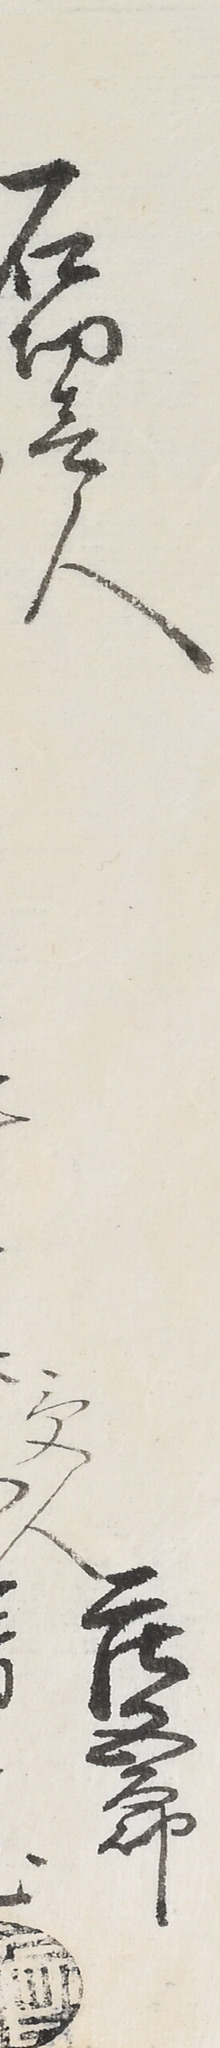一石切壱人庄五郎
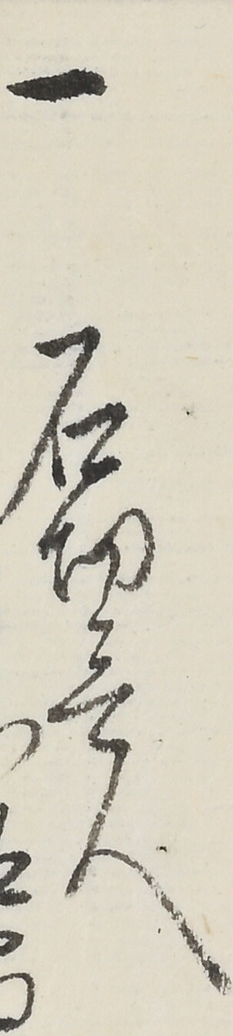一石切壱人芳蔵
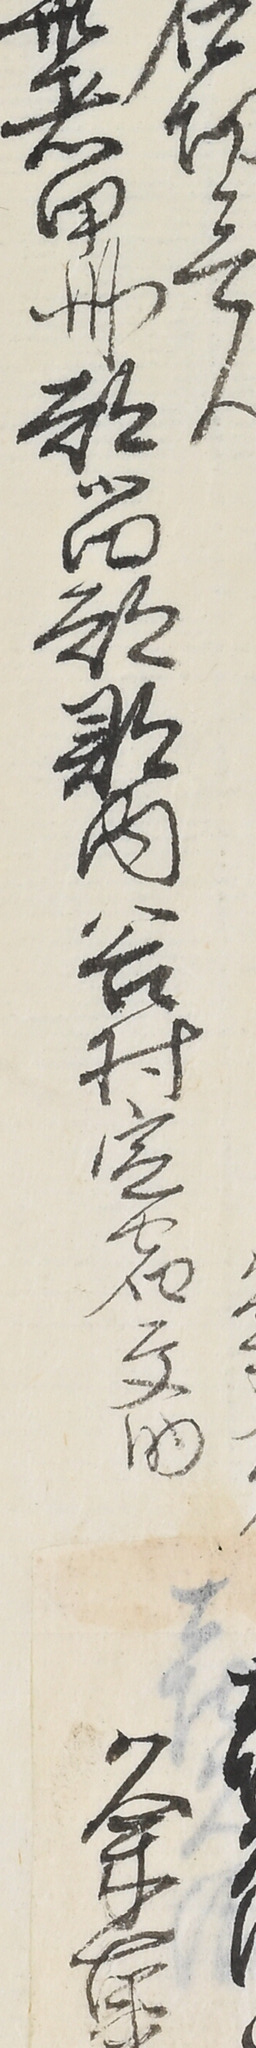此者甲州都留郡郡内谷村定宿文助久米右衛門
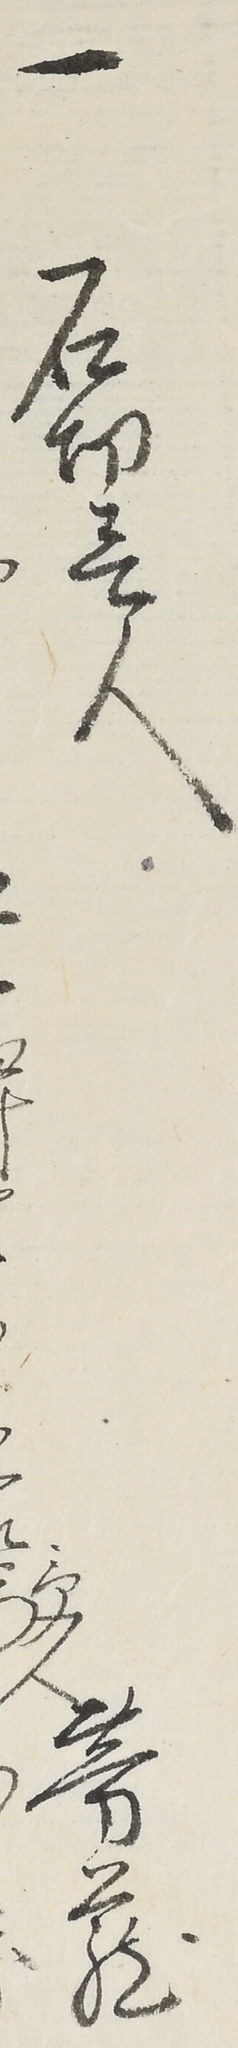一石切壱人芳蔵
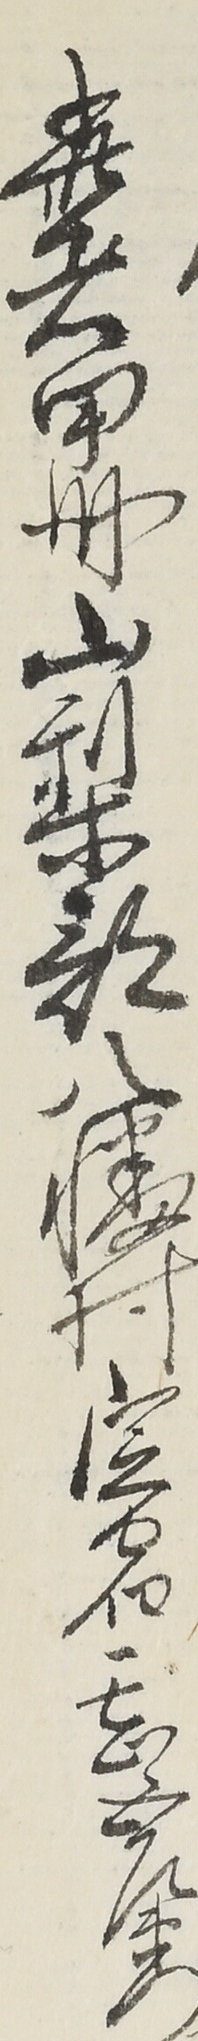此者甲州山梨郡八幡村定宿要兵衛

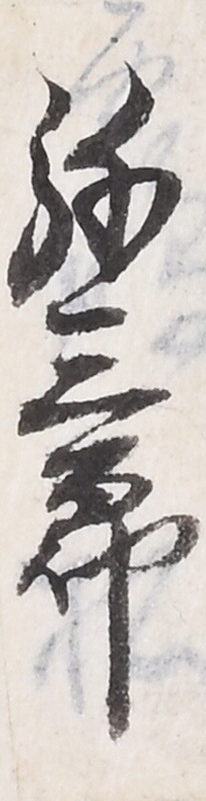弥三郎
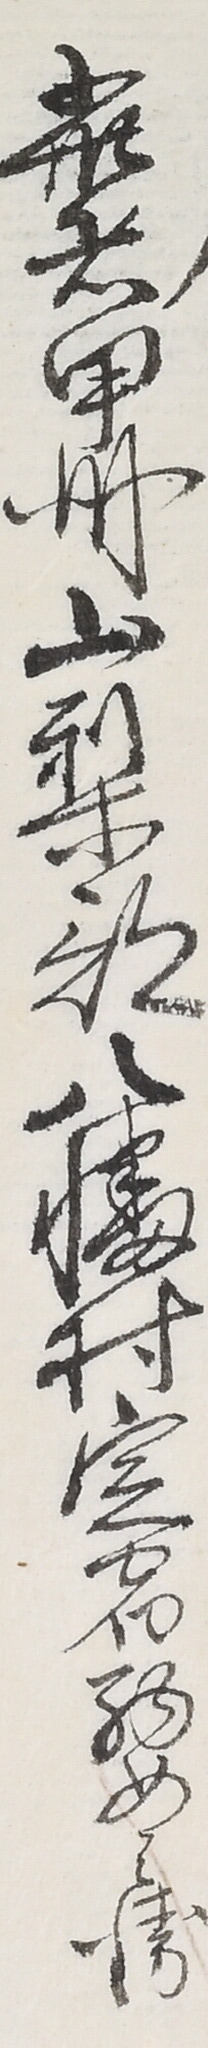此者甲州山梨郡八幡村定宿要兵衛
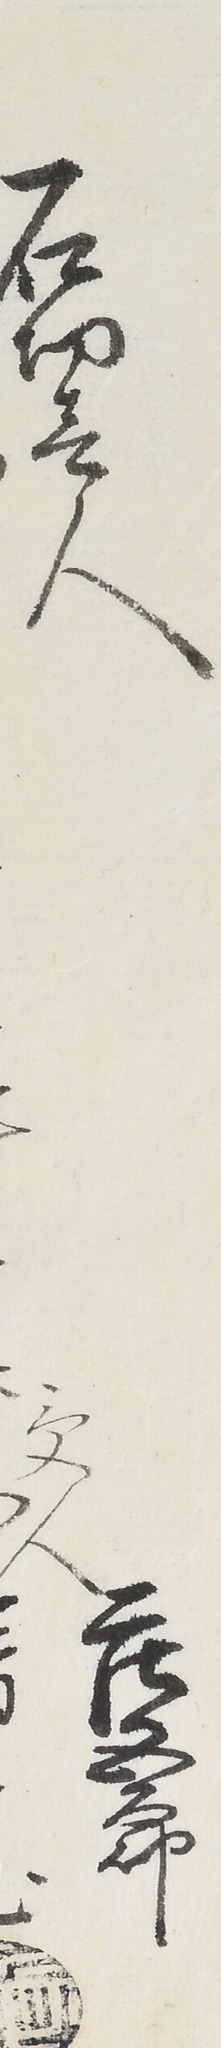一石切壱人庄五郎
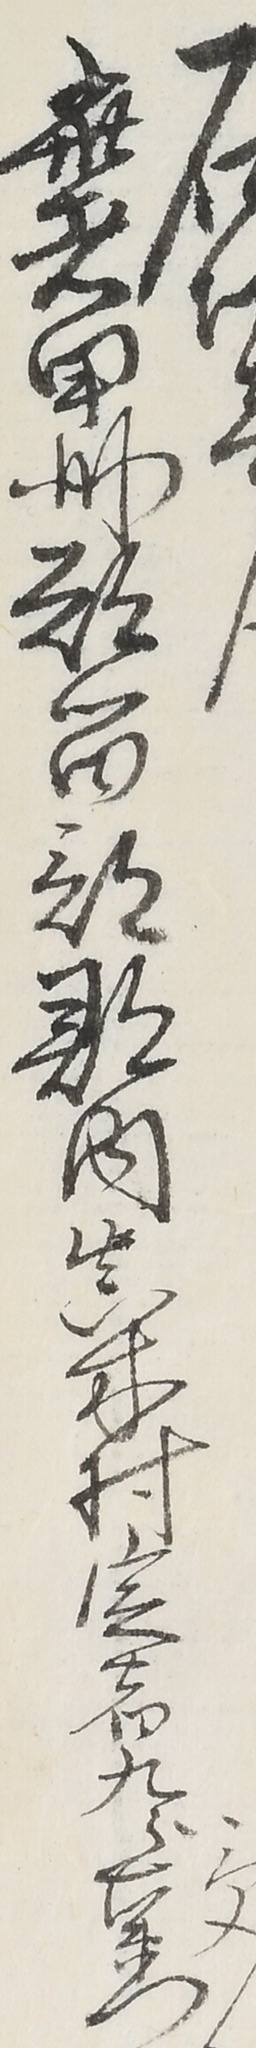此者甲州都留郡郡内真木村定宿九郎右衛門清蔵
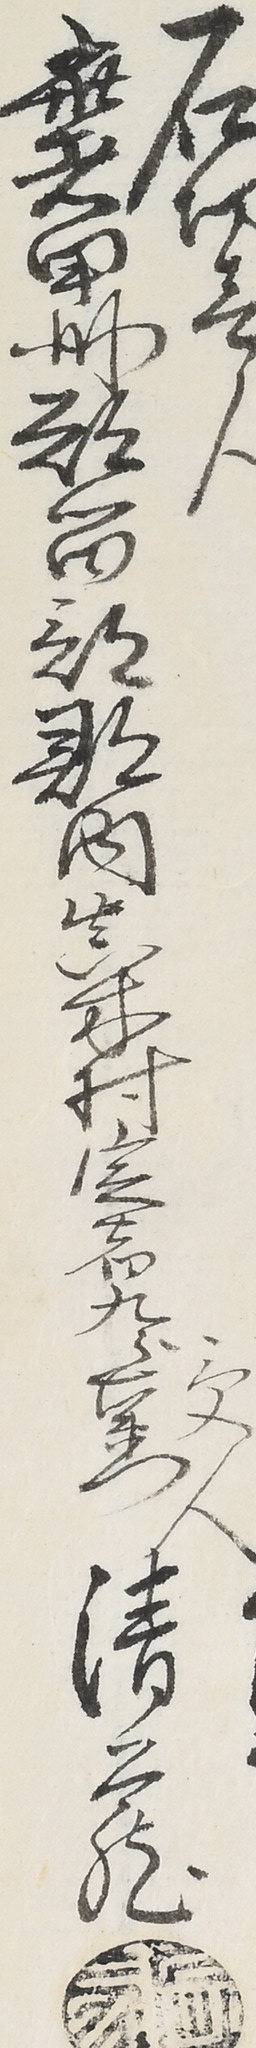此者甲州都留郡郡内真木村定宿九郎右衛門清蔵
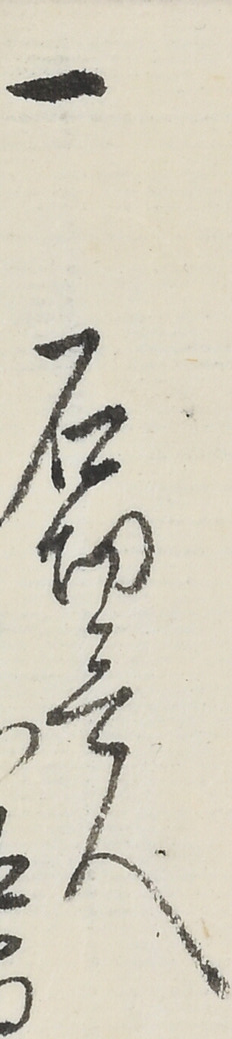一石切壱人芳蔵
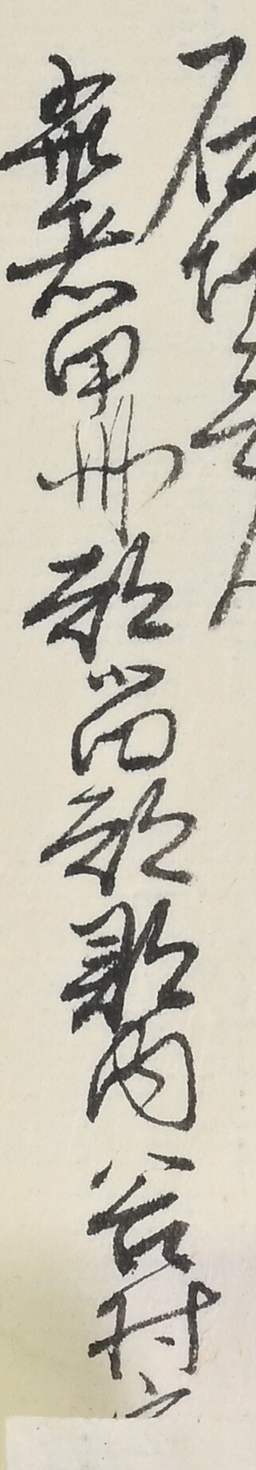此者甲州都留郡郡内谷村
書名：安政二乙卯年二月他國出石切名前書上帳
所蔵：伊那市立高遠町図書館・合同会社AMANE
